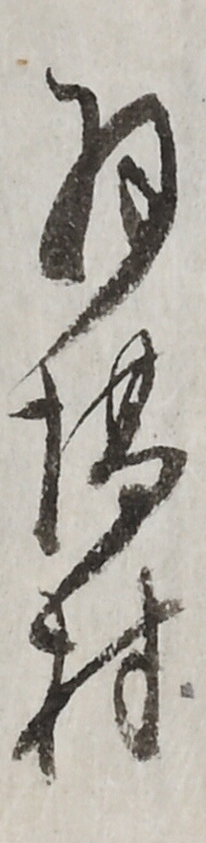羽場村
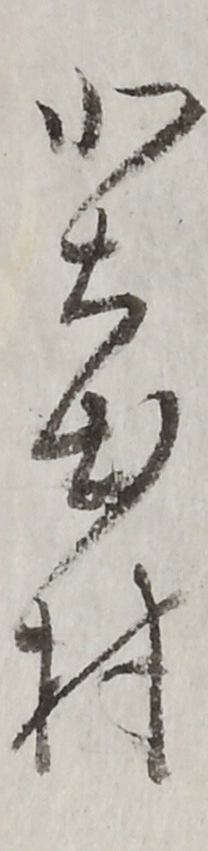北大出村

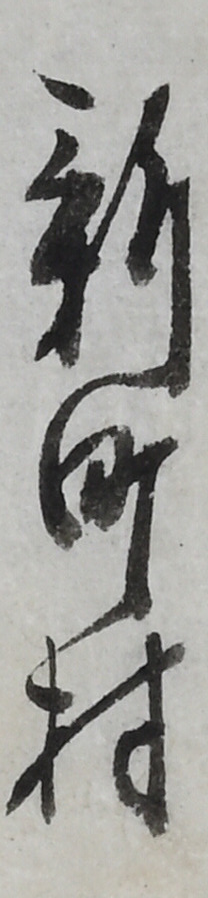新町村
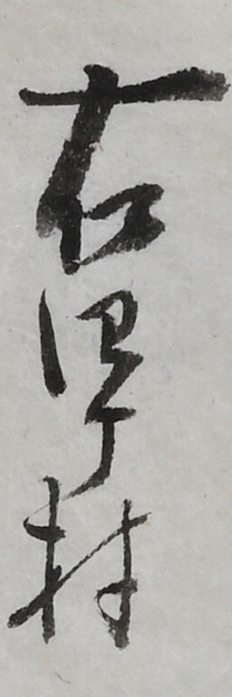右四ヶ村
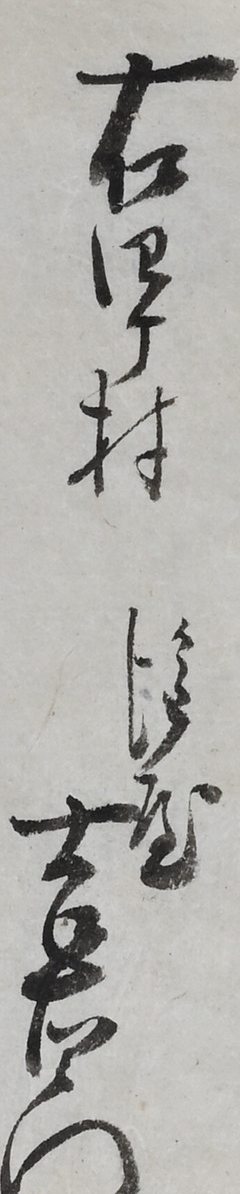右四ヶ村
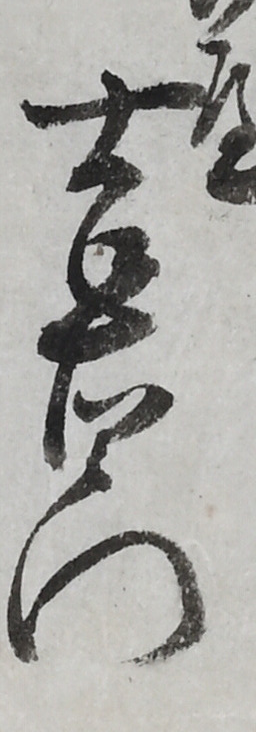吉右衛門
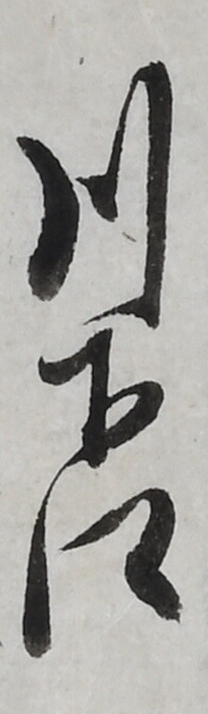川下郷
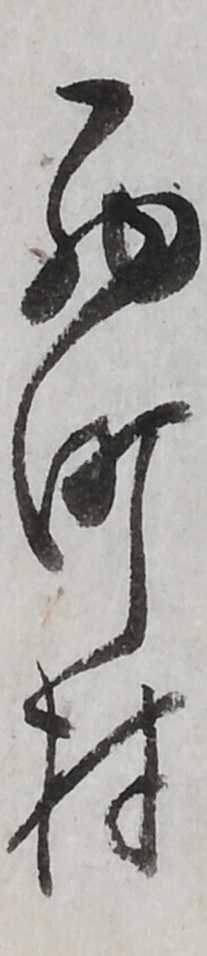西町村
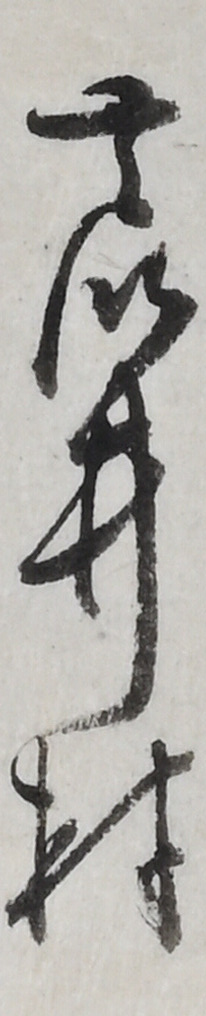荒井村
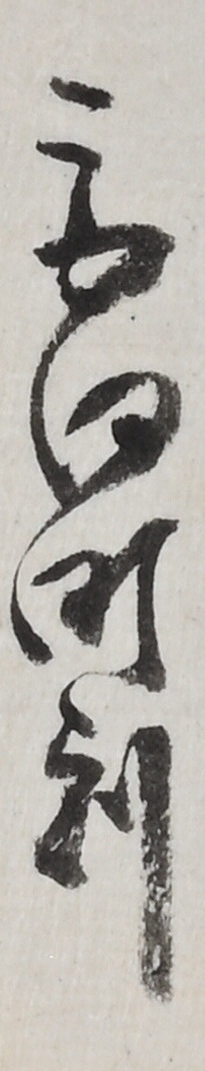宮田町割
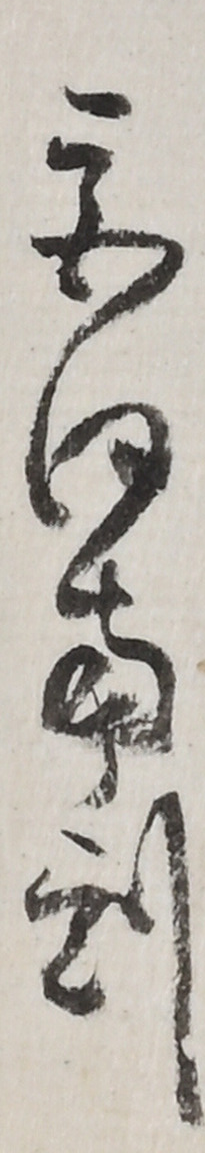宮田南割
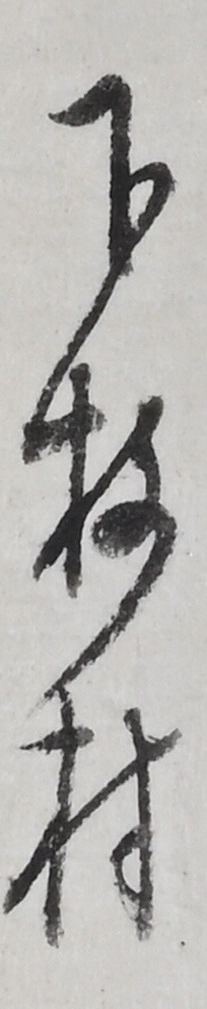下牧村
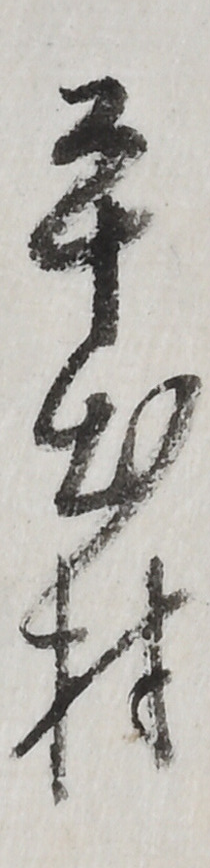平出村
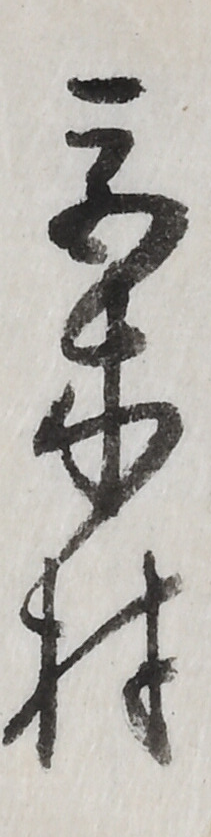宮木村
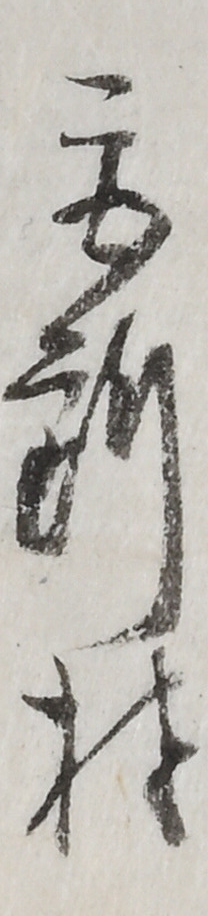宮所村
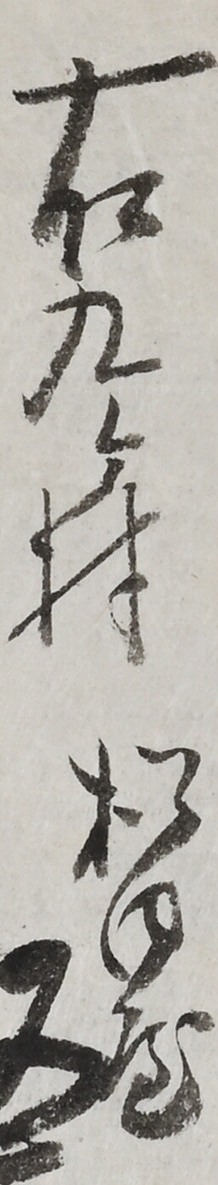右九ヶ村松田屋
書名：年内行事帳
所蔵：伊那市立高遠町図書館・合同会社AMANE
